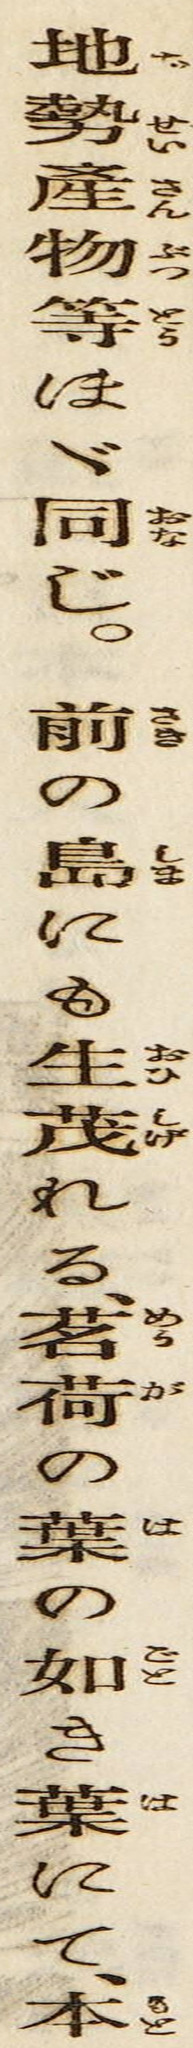地勢産物等ほヾ同じ。前の島にも生茂れる、茗荷の葉の如き葉にて、本
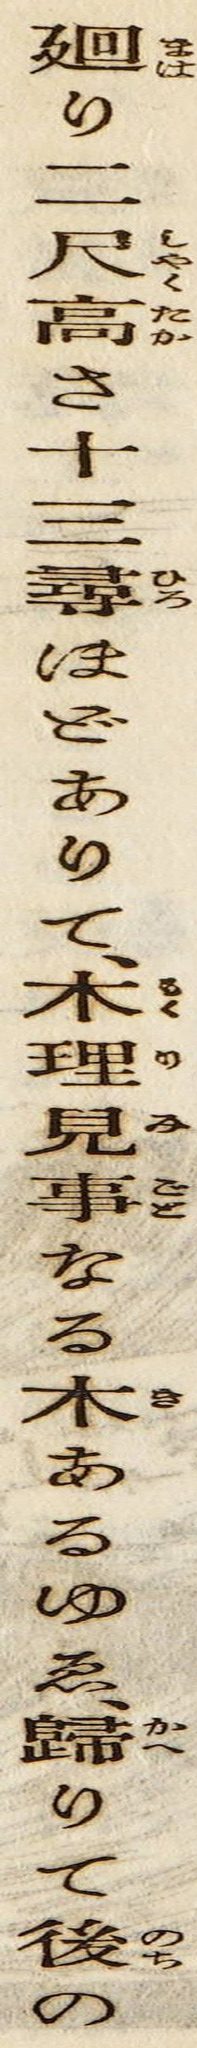廻り二尺高さ十三尋ほどありて、木理見事なる木あるゆゑ、帰りて後の
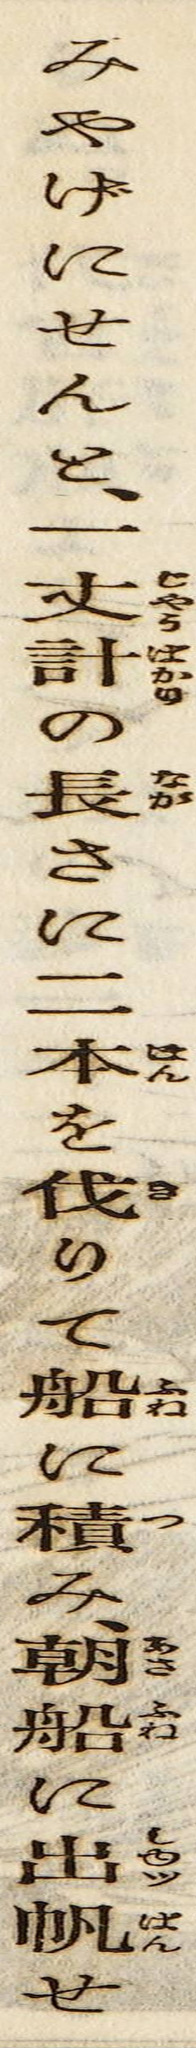みやげにせんと、一丈計の長さに二本を伐りて船に積み、朝船に出帆せ
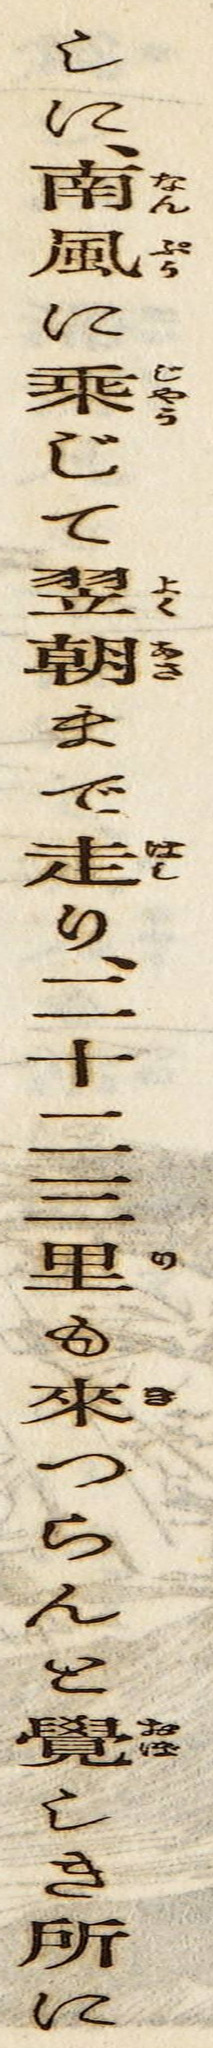しに、南風に乗じて翌朝まで走り、二十二三里も来つらんと覚しき所に
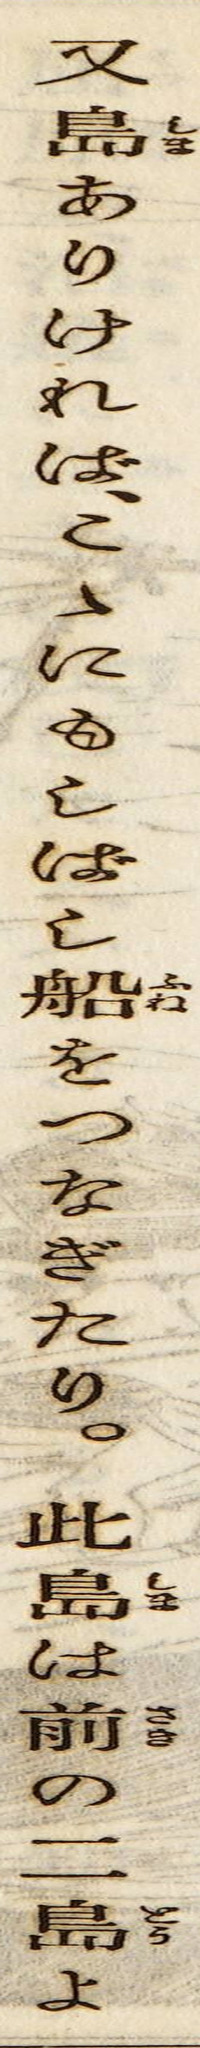又島ありければ、こゝにもしばし船をつなぎたり。此島は前の二島よ
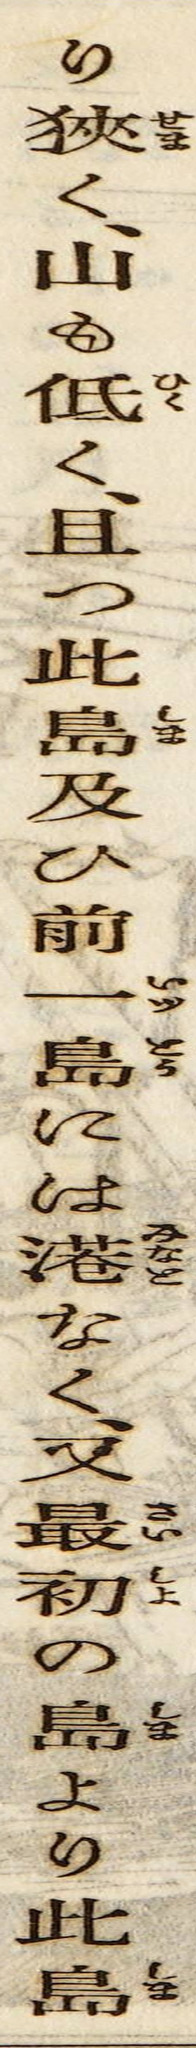り狭く、山も低く、且つ此島及ひ前一島には港なく、又最初の島より此島
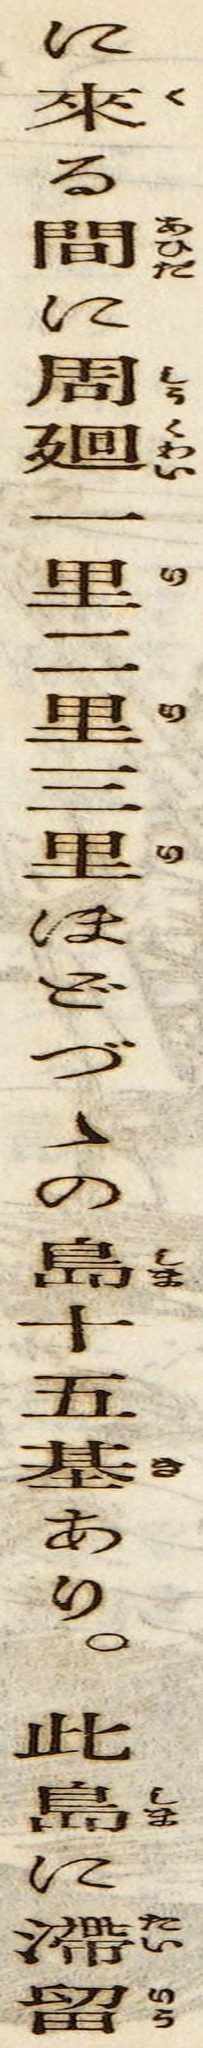に来る間に周廻一里二里三里ほどづゝの島十五基あり。此島に滞留
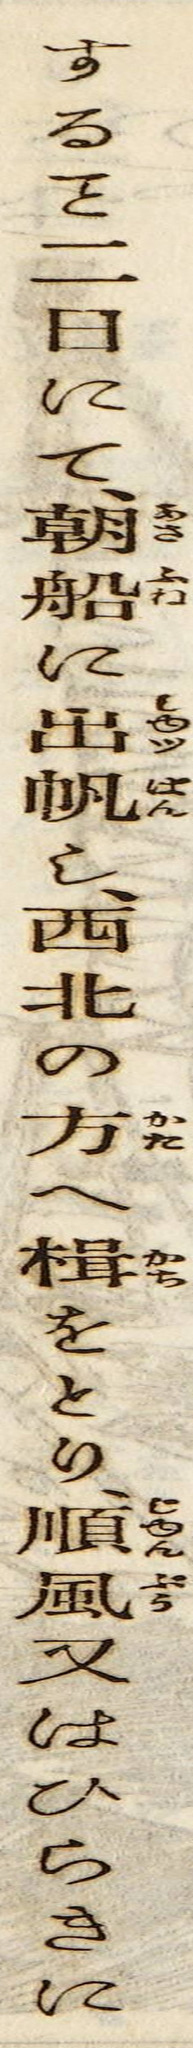すること二日にて、朝船に出帆し、西北の方へ楫をとり、順風又はひらきに
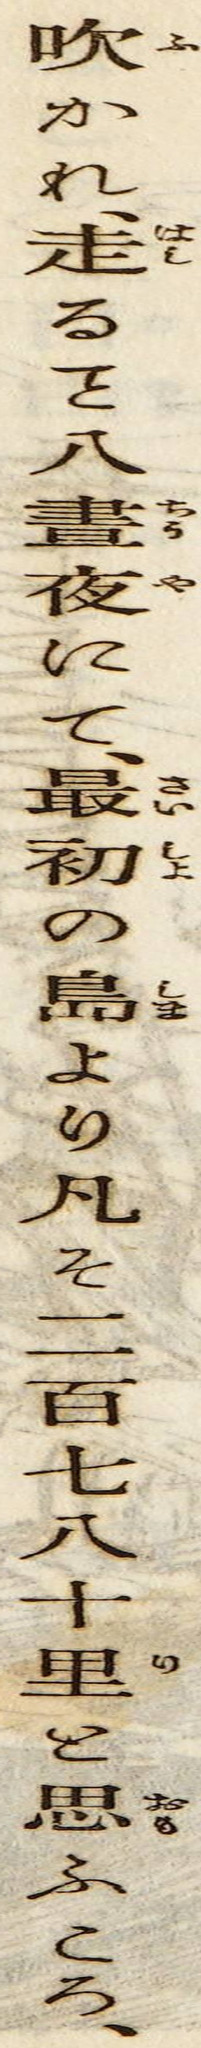吹かれ、走ること八昼夜にて、最初の島より凡そ二百七八十里と思ふころ、
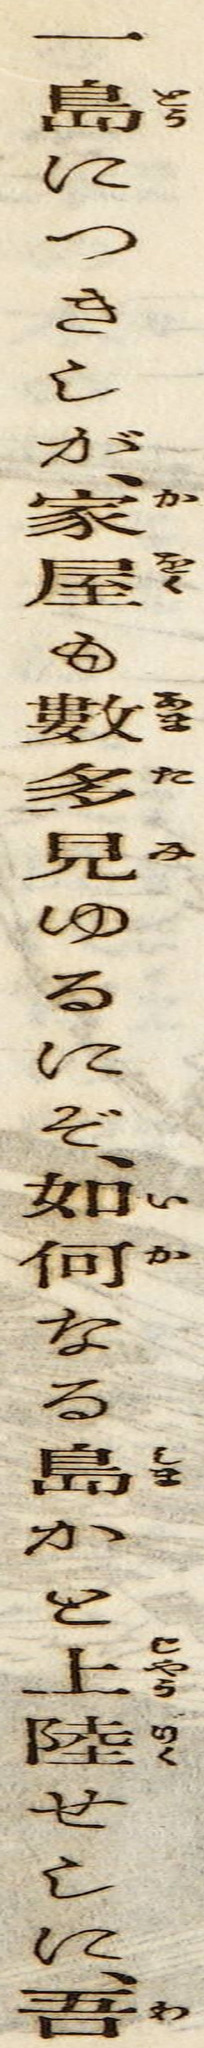一島につきしが、家屋も数多見ゆるにぞ、如何なる島かと上陸せしに、吾
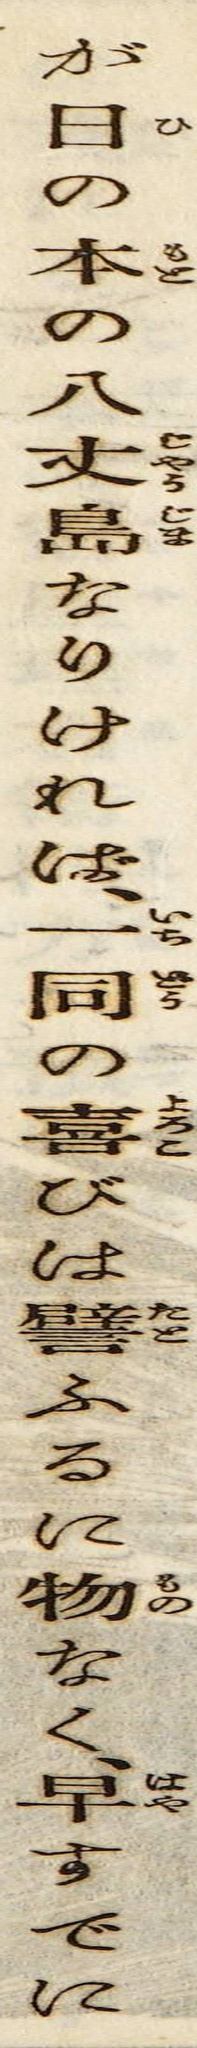が日の本の八丈島なりければ、一同の喜びは譬ふるに物なく、早すでに
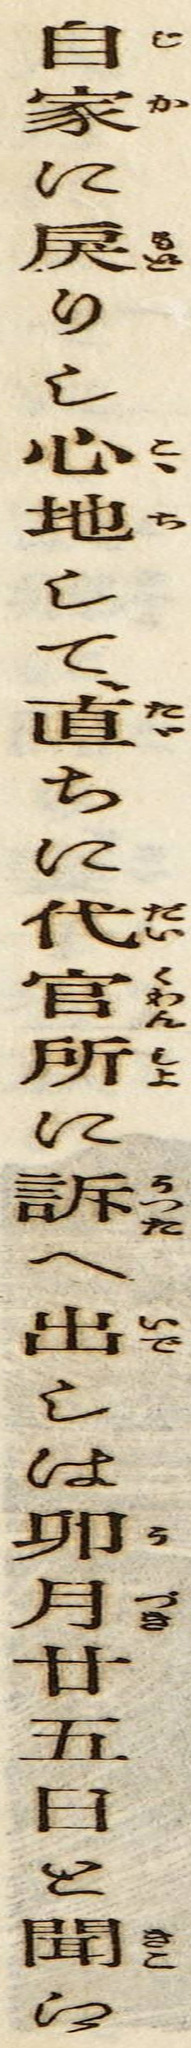自家に戻りし心地して、直ちに代官所に訴へ出しは卯月廿五日と聞え

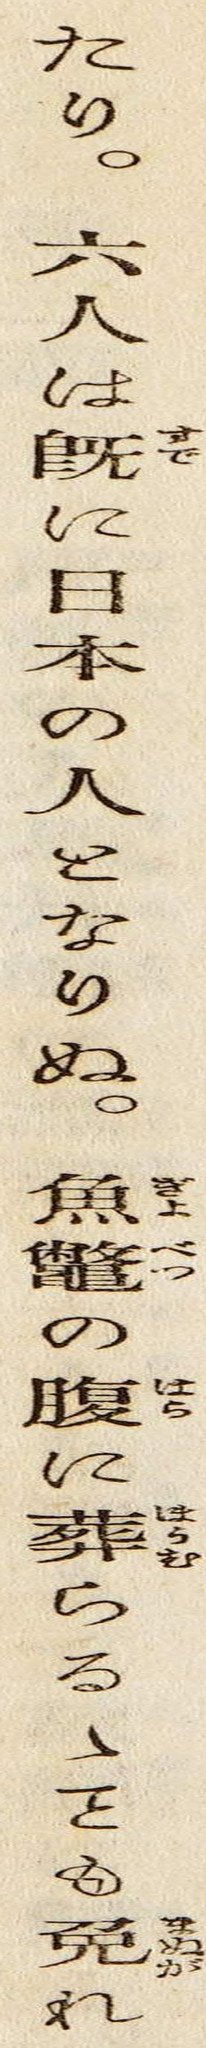たり。六人は既に日本の人となりぬ。魚鼈の腹に葬らるゝことも免れ
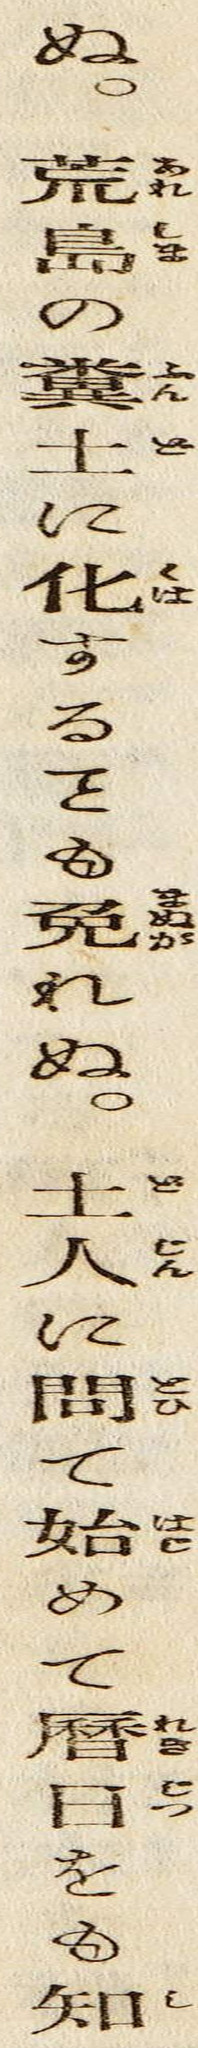ぬ。荒島の糞土に化することも免れぬ。土人に問て始めて暦日をも知
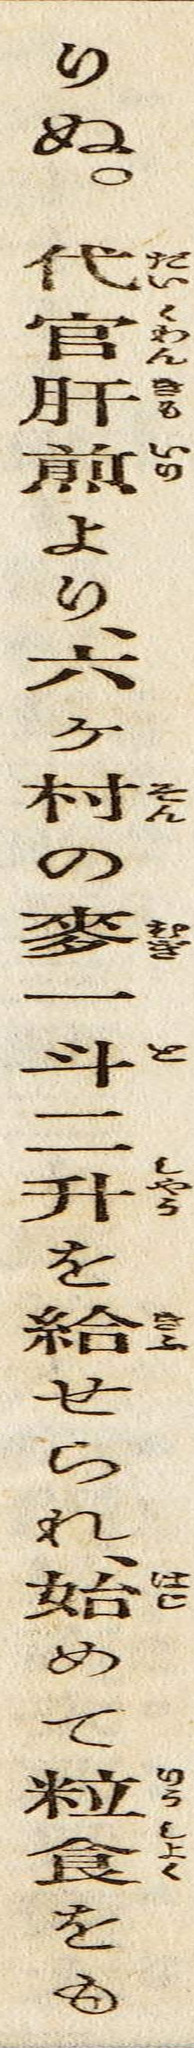りぬ。代官肝煎より、六ケ村の麦一斗二升を給せられ、始めて粒食をも
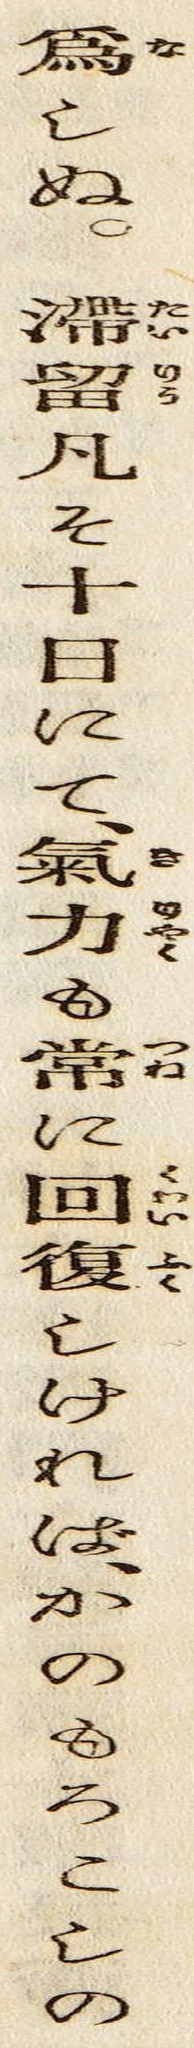為しぬ。滞留凡そ十日にて、気力も常に回復しければ、かのもろこしの
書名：日本漂流譚
